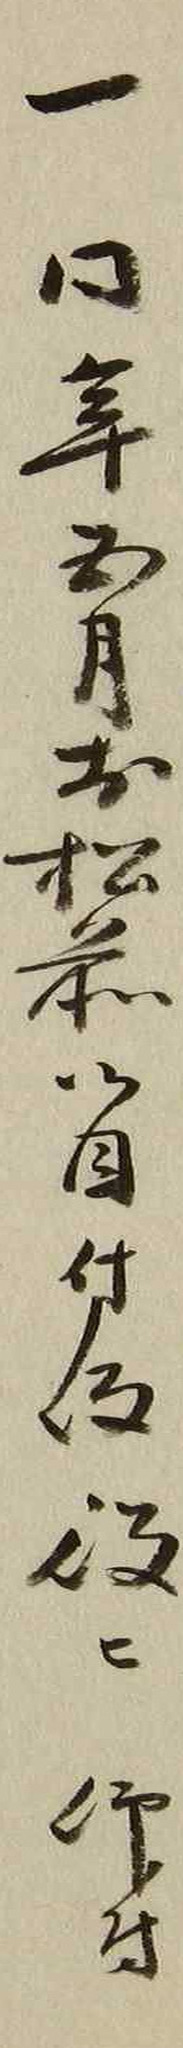一同年五月於松前御目付仮役被仰付
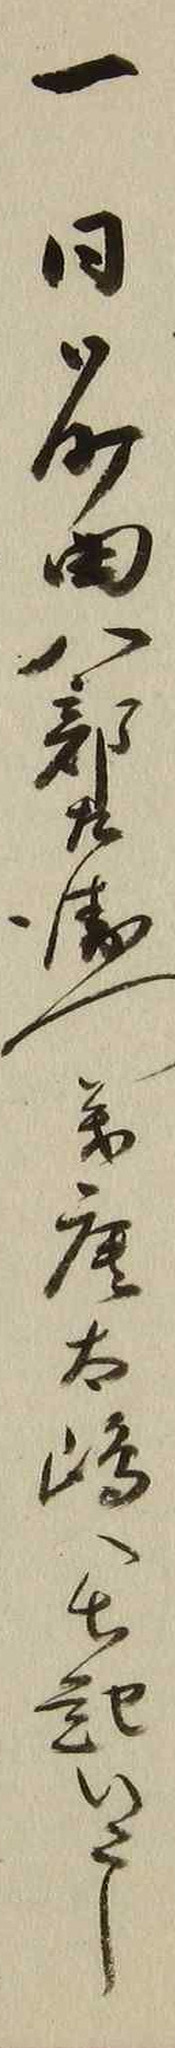一同日町田八郎左衛門義唐太島へ出起いたし
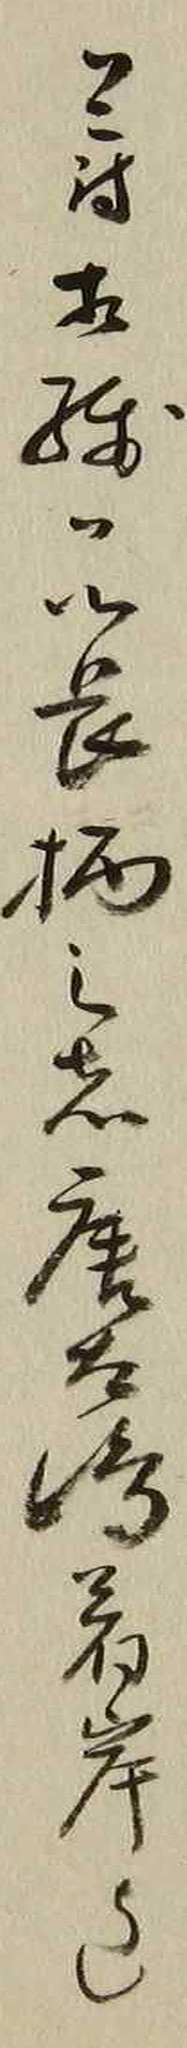候ニ付相残候御長柄之者唐太島着岸迄
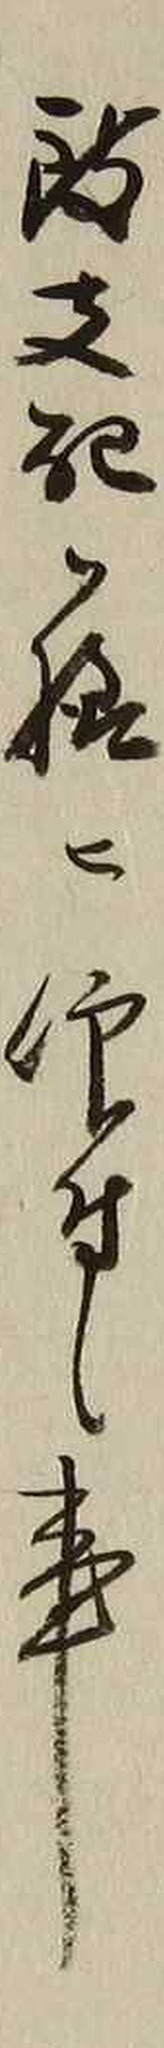致支配候様被仰付候事
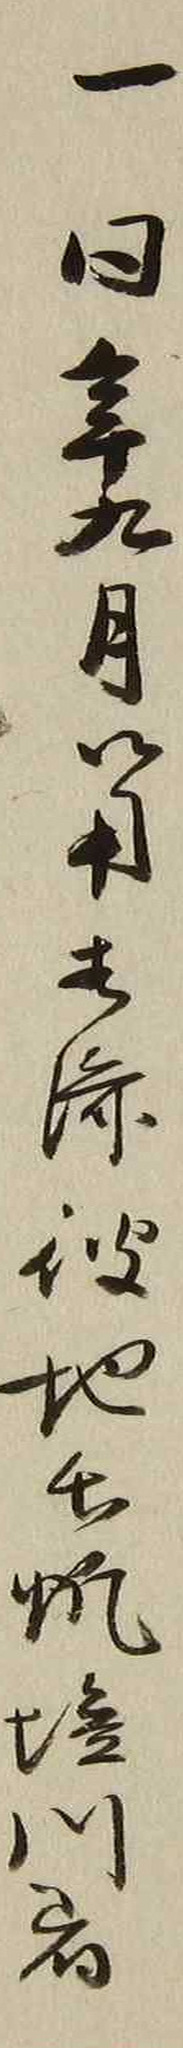一同年九月御用相済彼地出帆塩川着
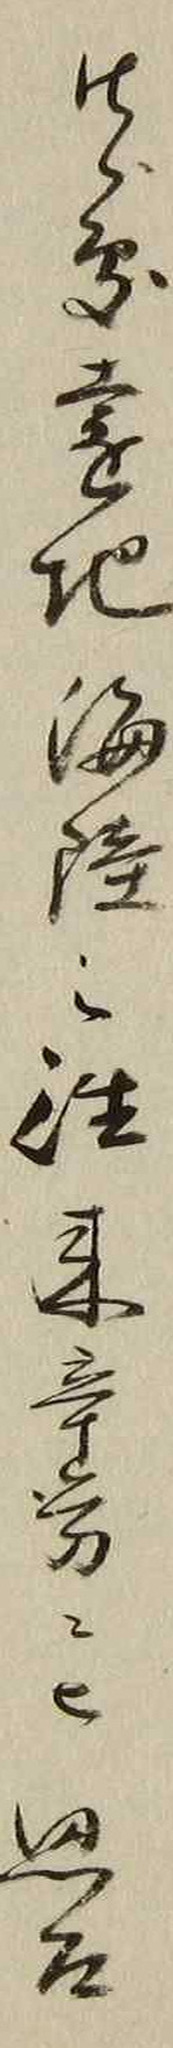仕候処遠地海陸之往来辛労ニ被思召
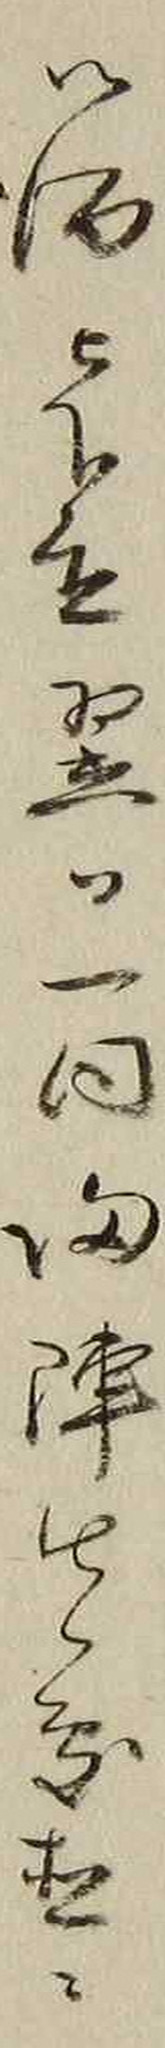御酒被下置翌御一同帰陣仕候処直ニ
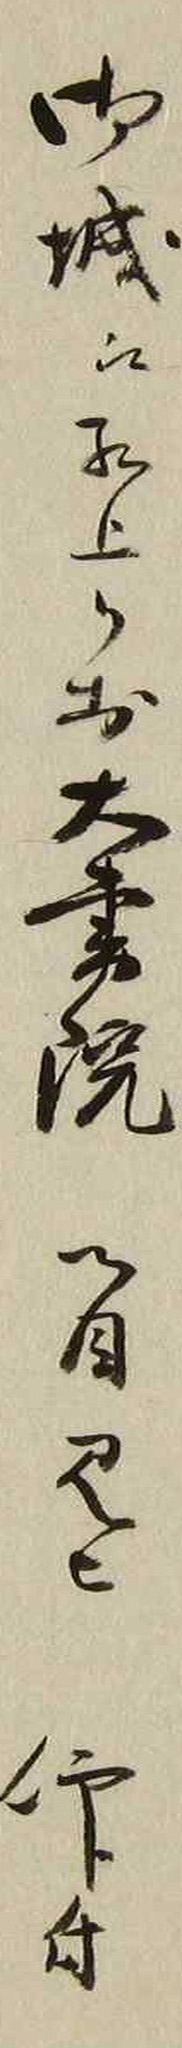御城江相上り於大書院御目見被仰付
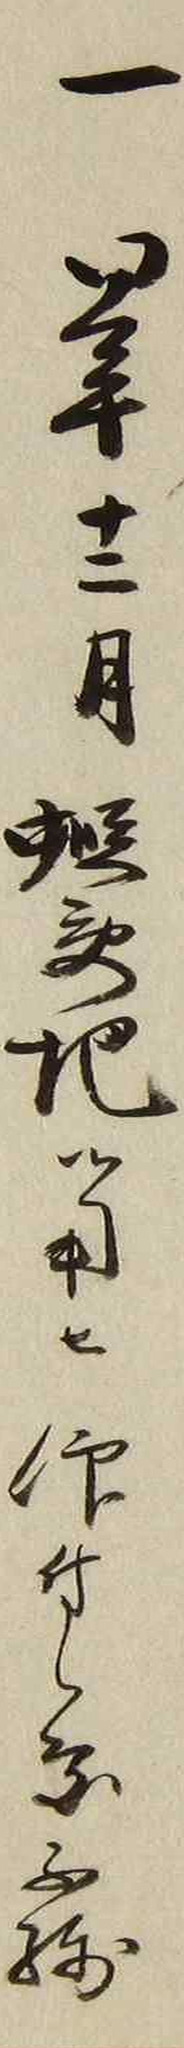一同年十二月蝦蝦夷地御用被仰付候処不残
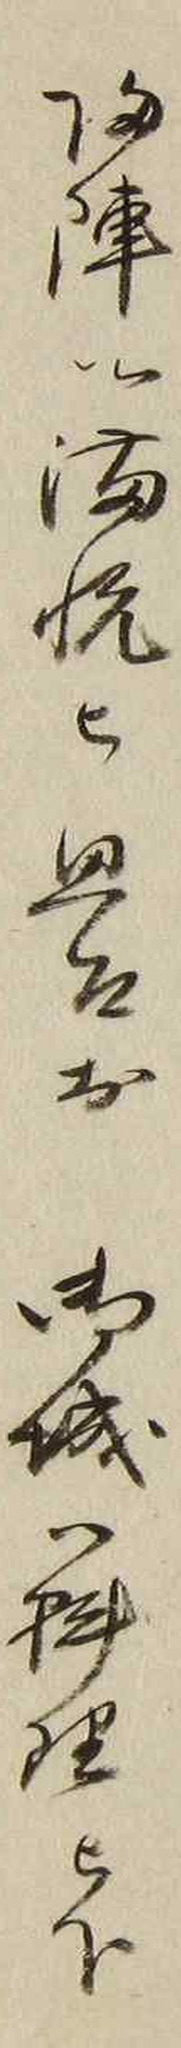帰陣御満悦被思召於御城御料理被下
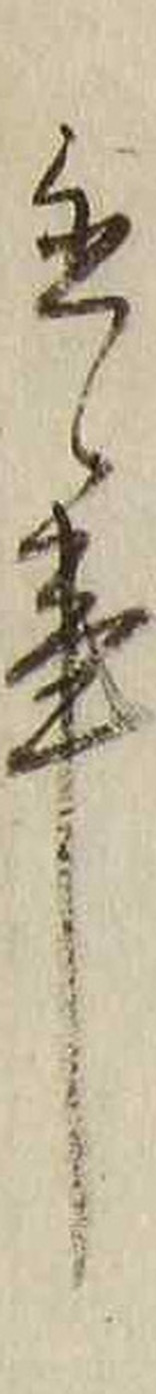置候事
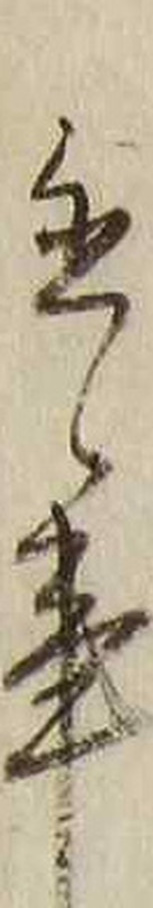置候事
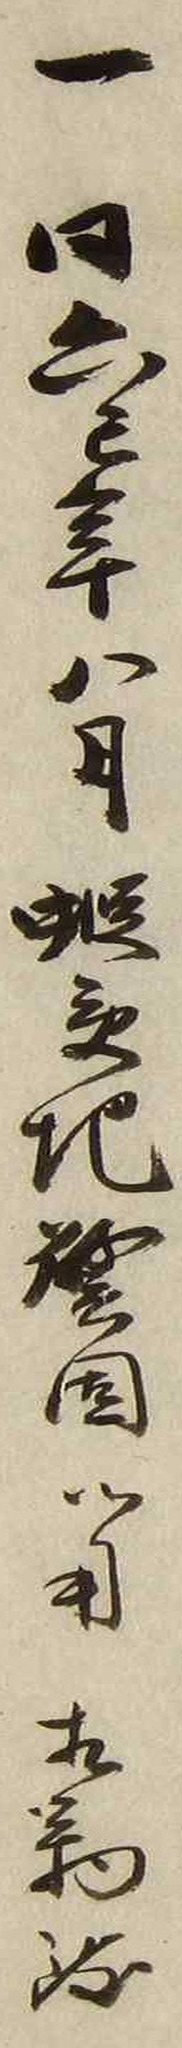一同六巳年八月蝦夷地警固御用相勤致

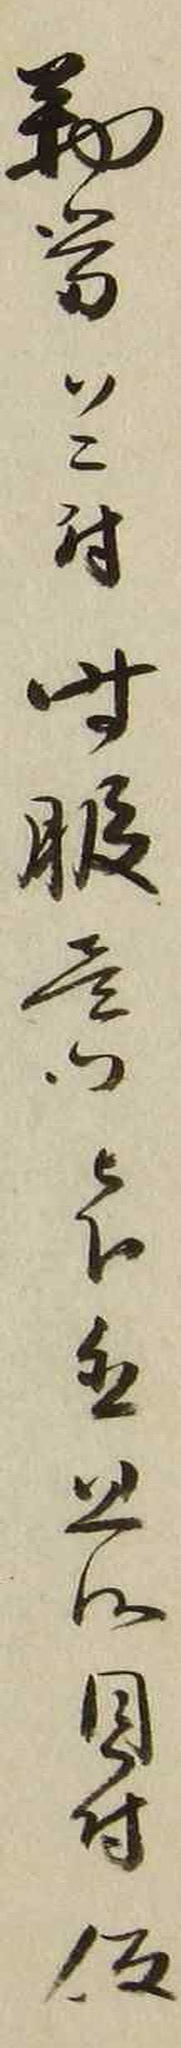勤番候ニ付時服壱ツ被下置且御目付仮
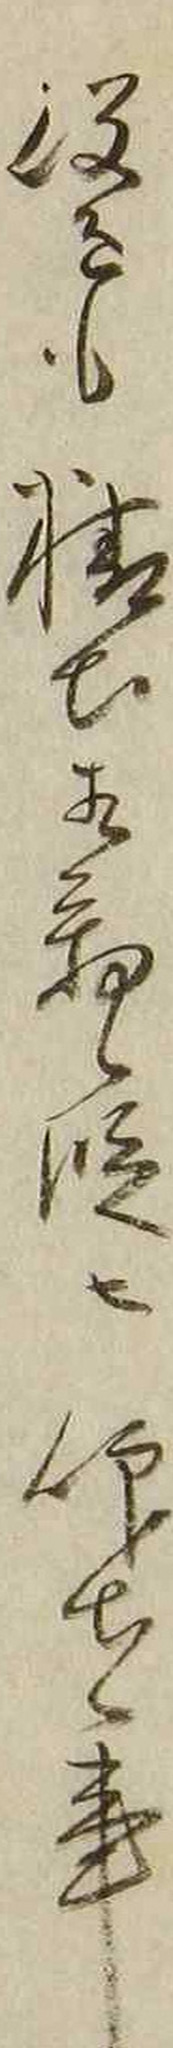役をも精出相勤候段被仰出候事
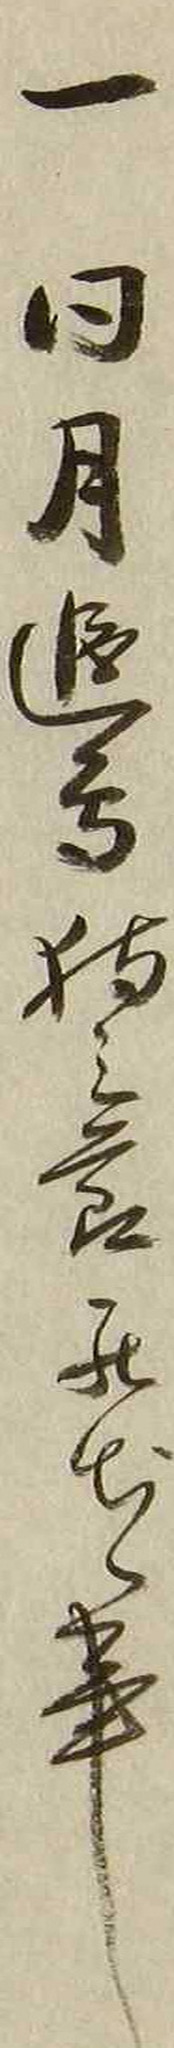一同月追鳥狩之節罷出候事
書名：諸士系譜　巻之311　し之部1
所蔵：会津若松市立会津図書館
